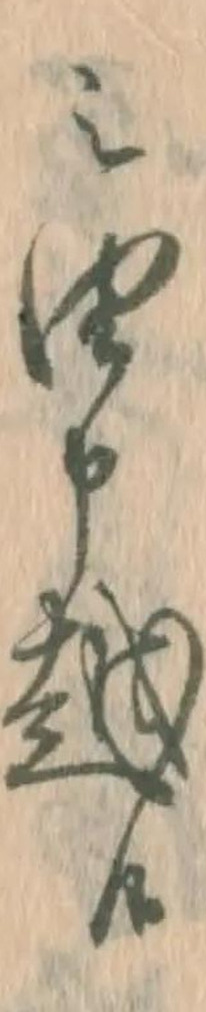之由申越候
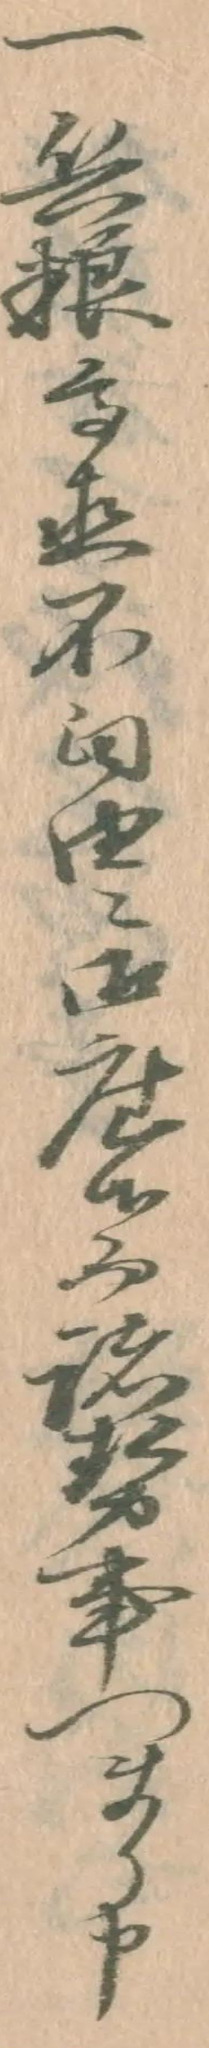一兵粮高直不自由に御座候而諸勢事つまり申
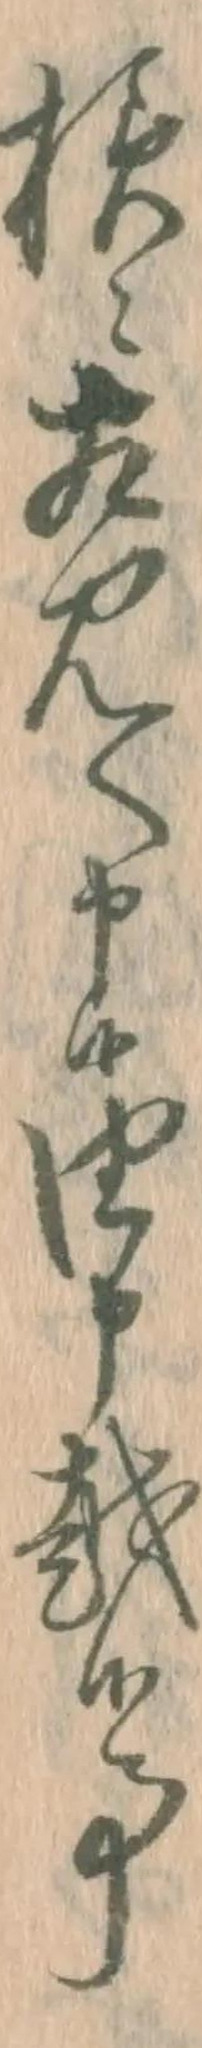様に相見へ申候由申越候事
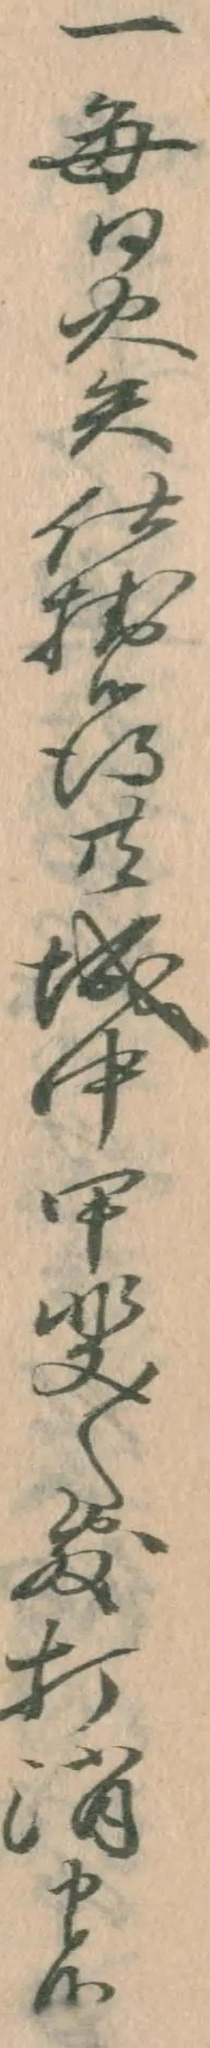一毎日火矢仕掛候得共城中甲斐へ處打消申候
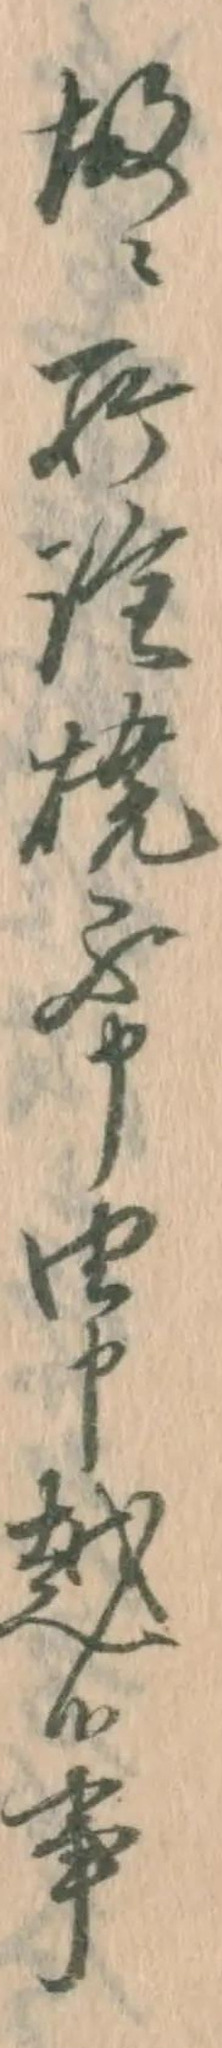故に所詮焼ふ申由申越候事
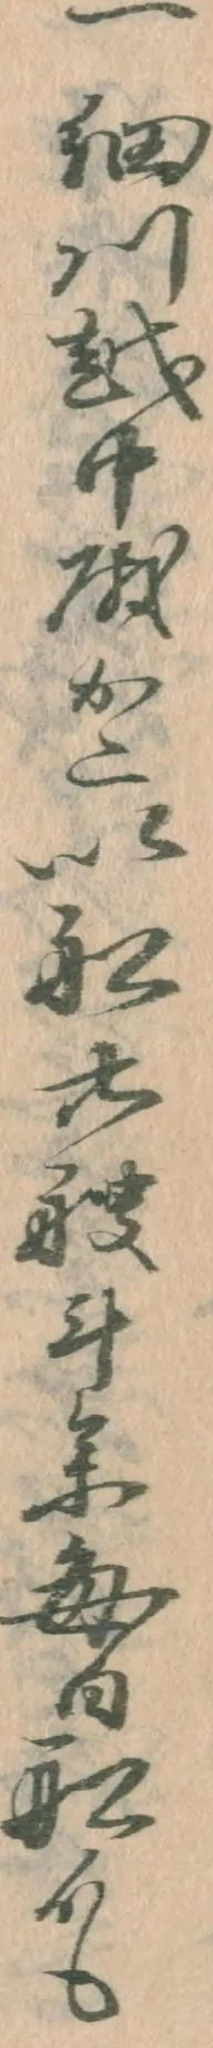一細川越中殿かこ以舩廿艘斗参毎日舩ゟも
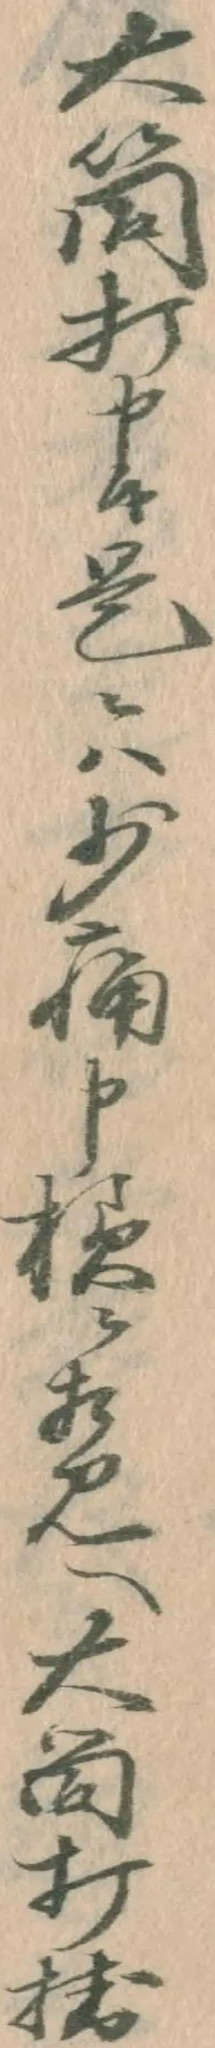大筒内申候是には少痛申様に相見へ大筒内掛
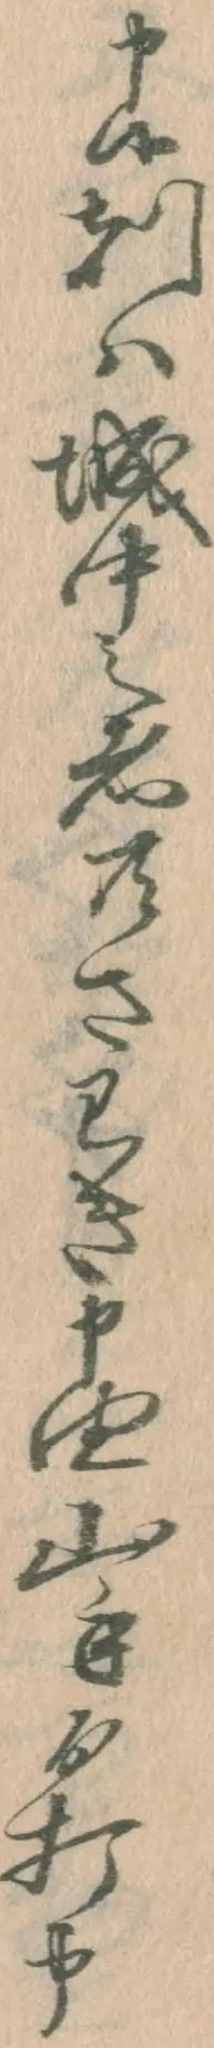申候刻は城中之者共さ已き申由山手ゟ打申
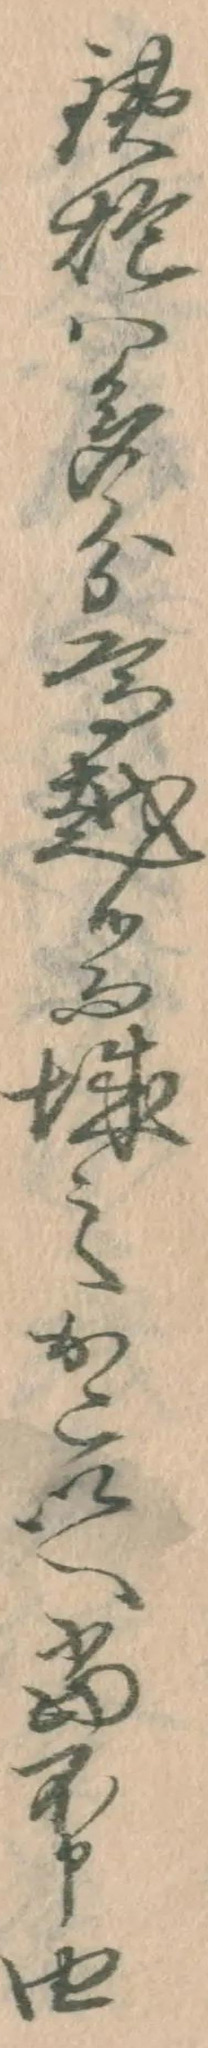鉄炮は多分高越候而城之かこ以へ当不申由
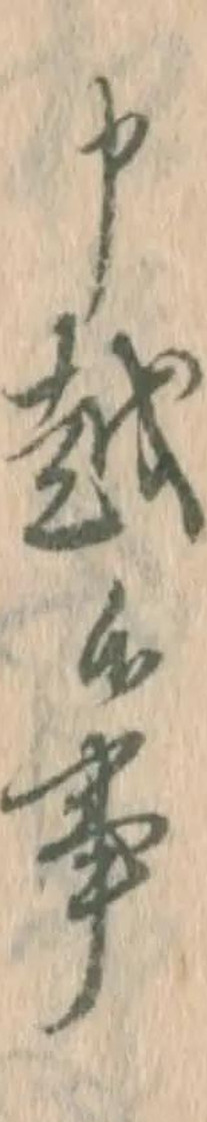申越候事
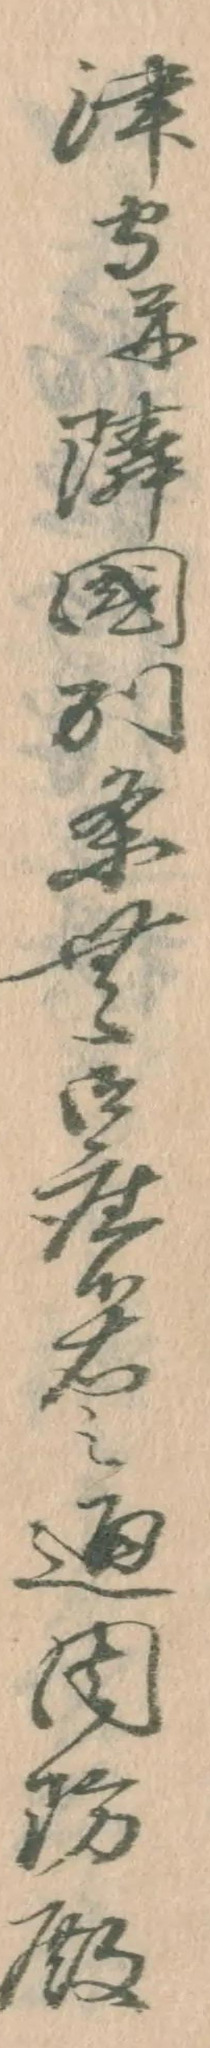一津守幷隣国別条無御座候右之通周防殿
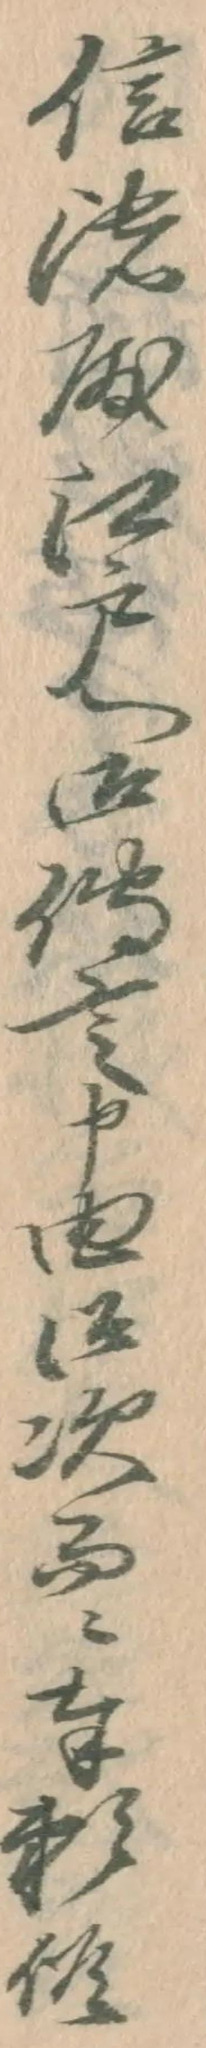信濃殿江戸へ御伝言申由御次而に奉願候
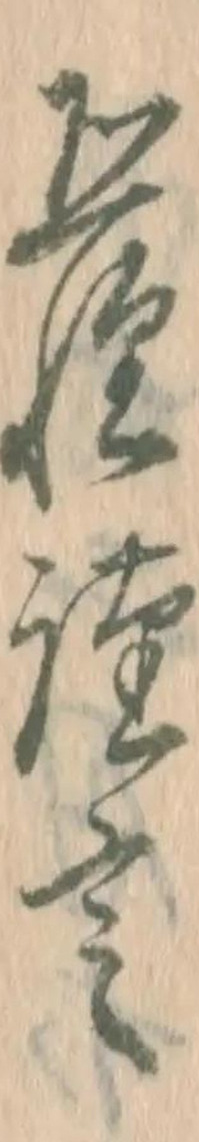恐惶謹言

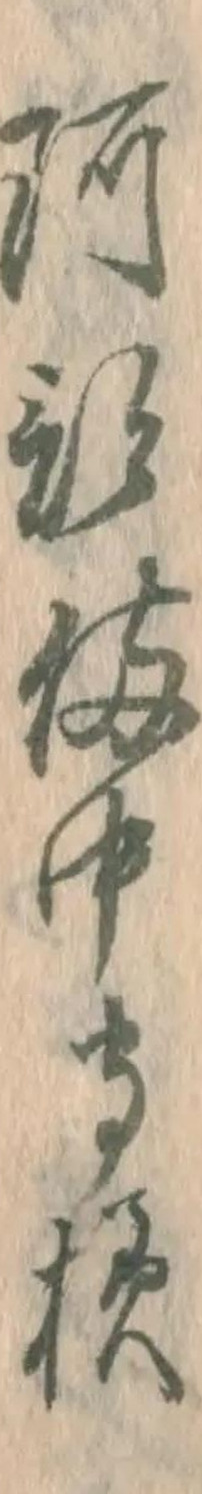阿部備中守様
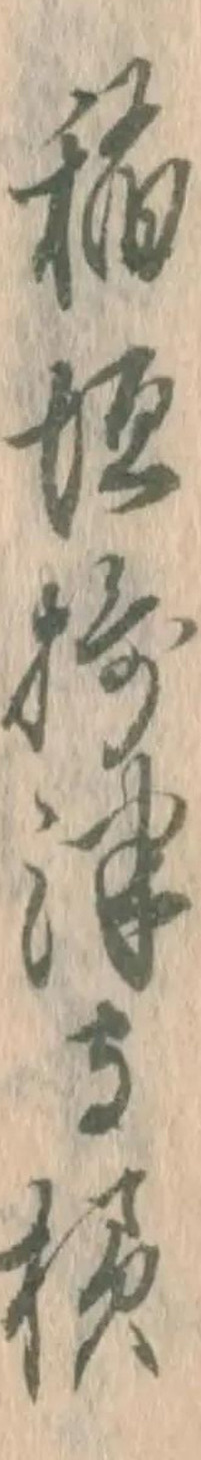稲垣摂津守様
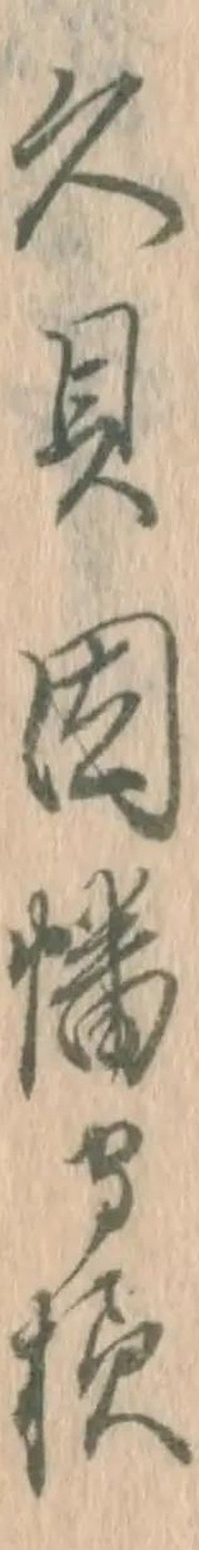久貝因幡守様
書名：切支丹御退治記 49巻. [5]
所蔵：国立国会図書館 National Diet Library, JAPAN
